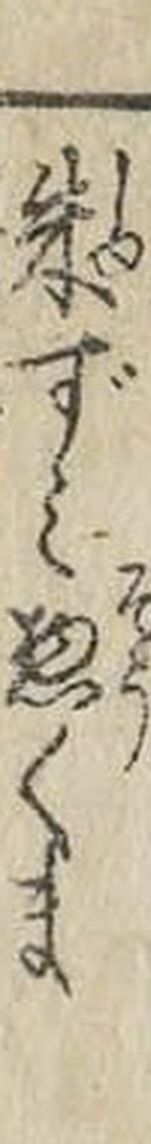朱ずみ総くま
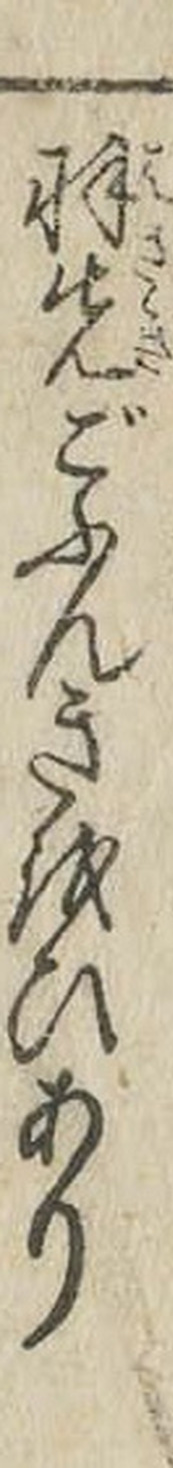羽先ごふんきをひあり
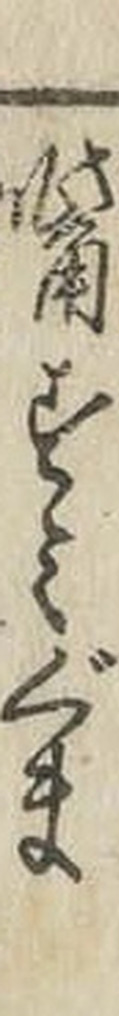嘴すみぐま
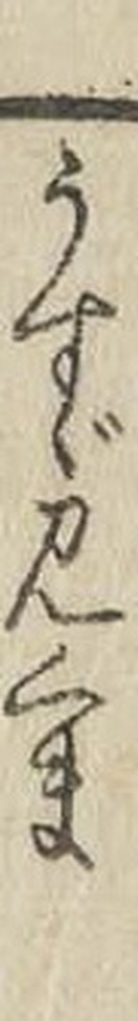うすゞみくま
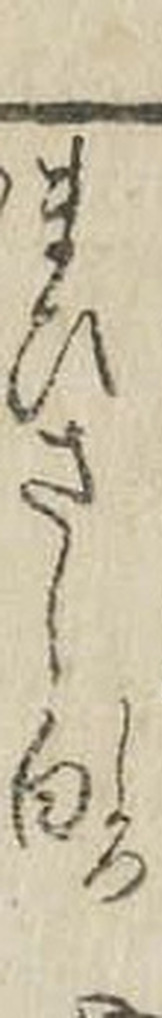まひさし白
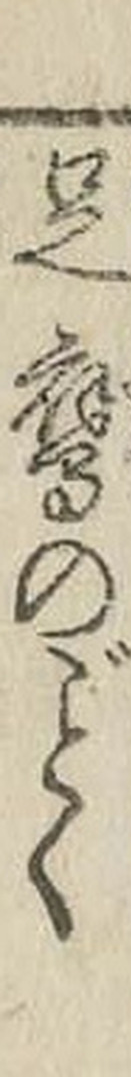足鷹のごとく
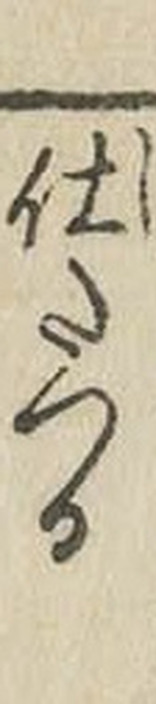仕たつる
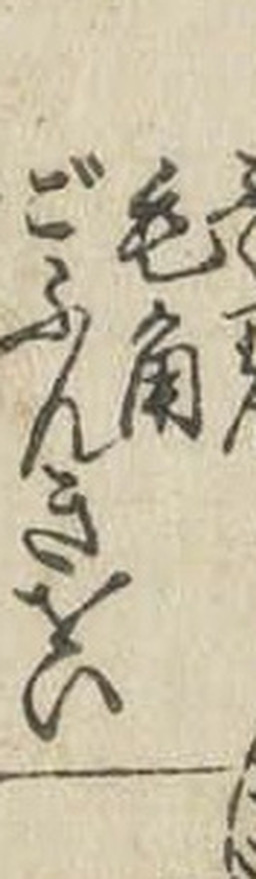ごふんきをい
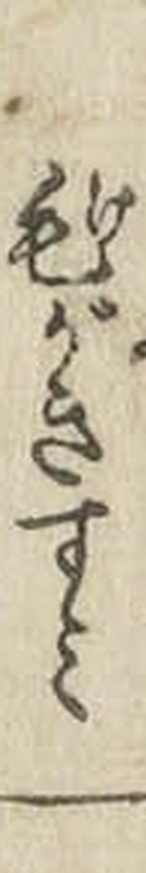毛がきすみ
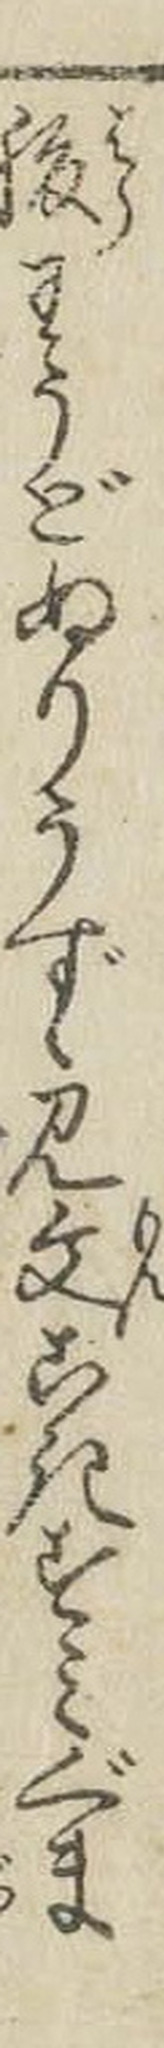腹わうどぬりうすゞみ文こきすみぐま
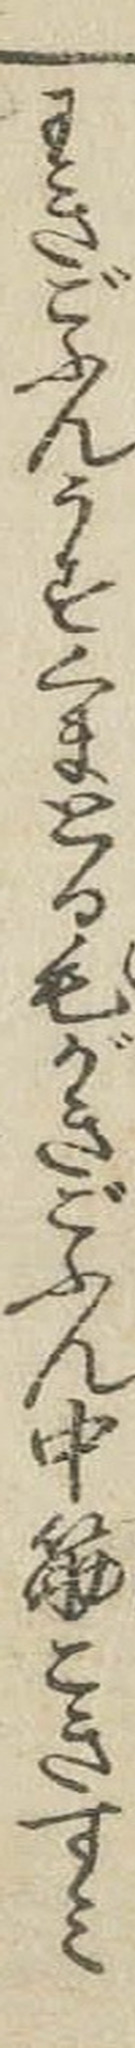わきごふんうすくまとる毛がきごふん中筋こきすみ
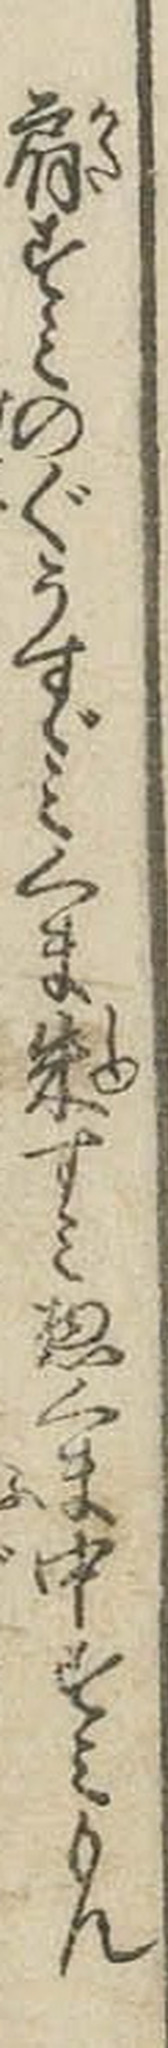肩すみのぐうすゞみくま朱すみ総くま中すみもん
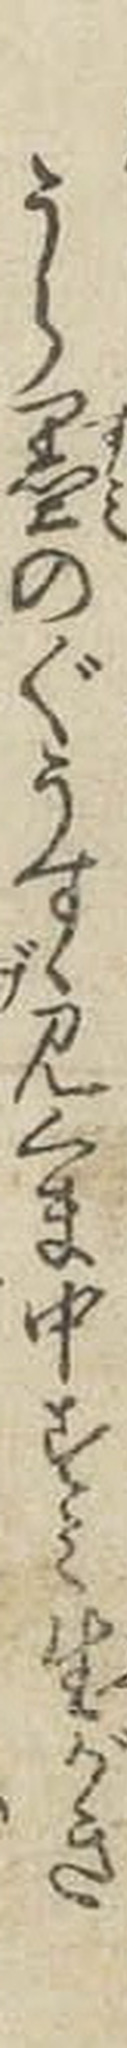うら墨のぐうすゝみくま中すみ生がき
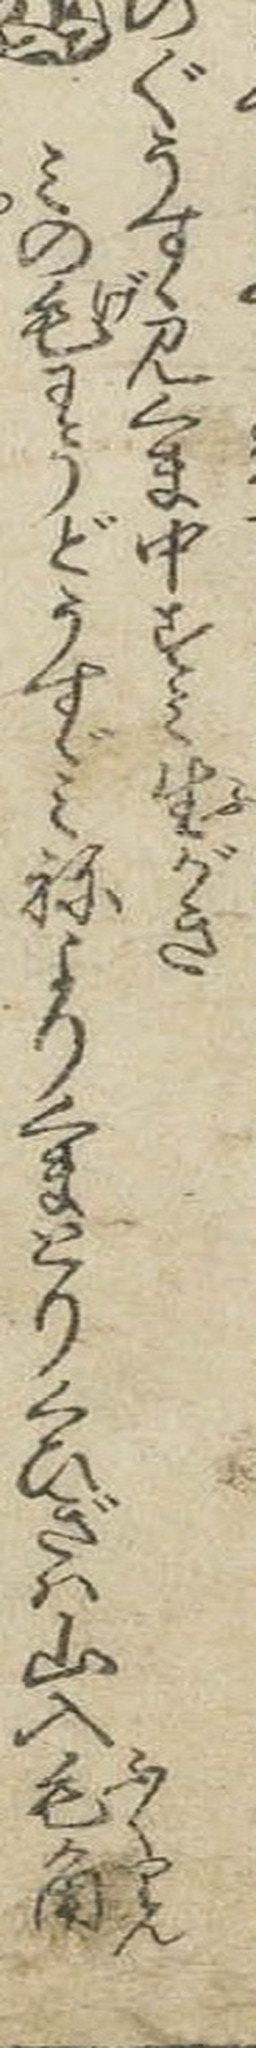みの毛わうどうすゞみねよりくまとりくひぎは山入毛角
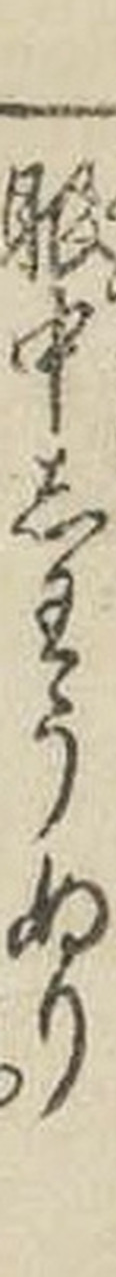眼中しわうぬり
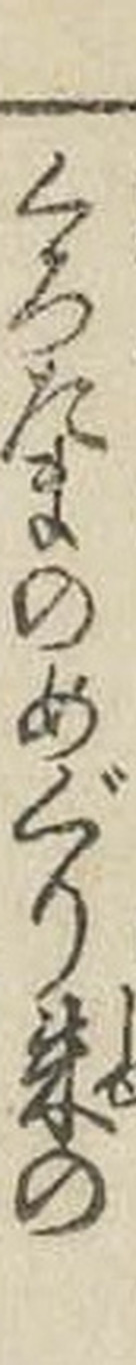くろたまのめぐり朱の
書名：絵本写宝袋 9巻 8之巻
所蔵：東京学芸大学教育コンテンツアーカイブ
